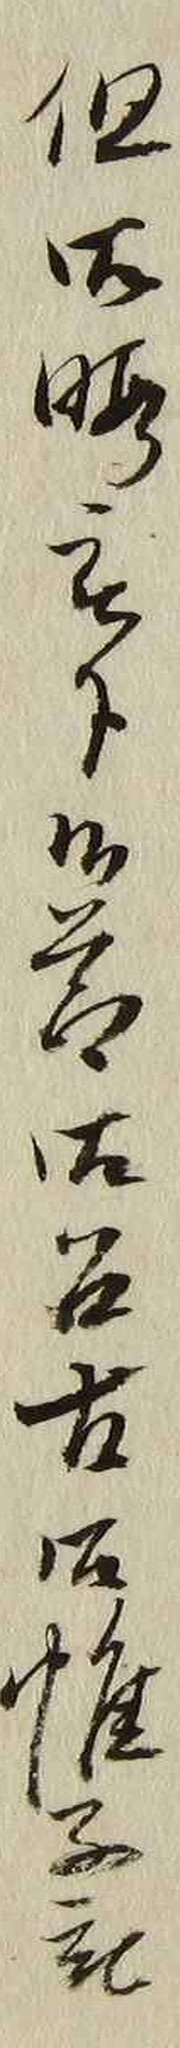但御暇被下候節御召古御帷子被
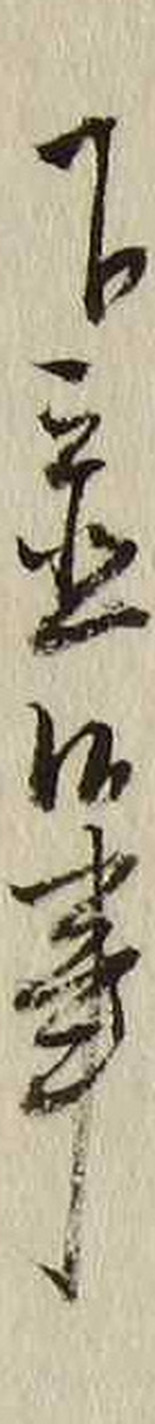下置候事
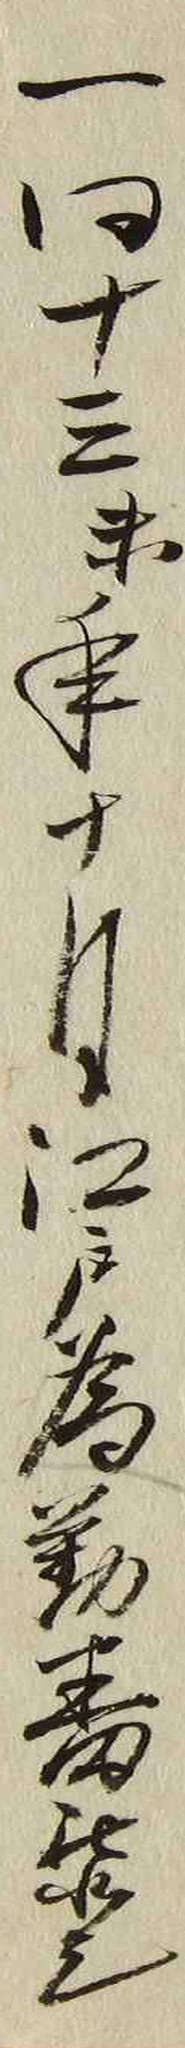一同十三未年十月江戸為勤番罷登
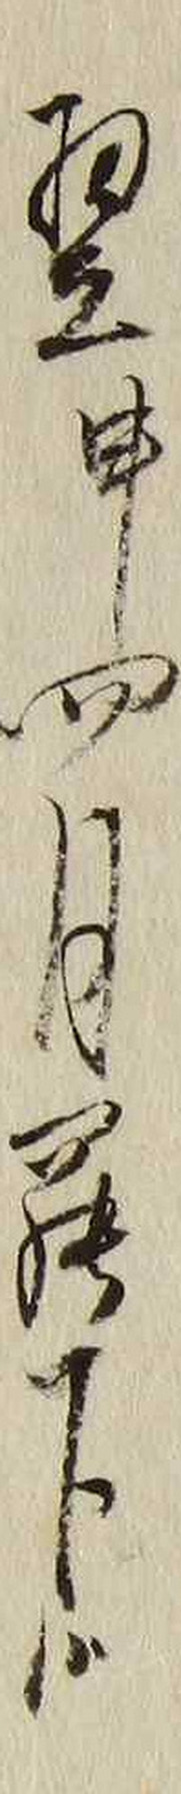翌申四月罷下候
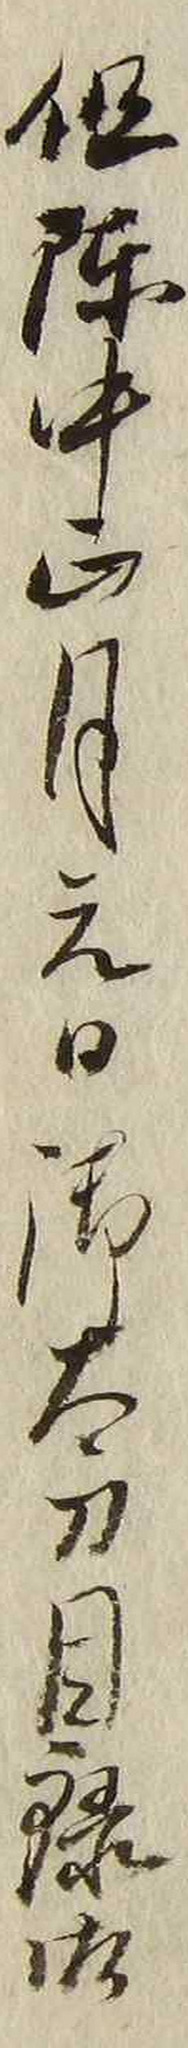但陣中正月元日御太刀目録御

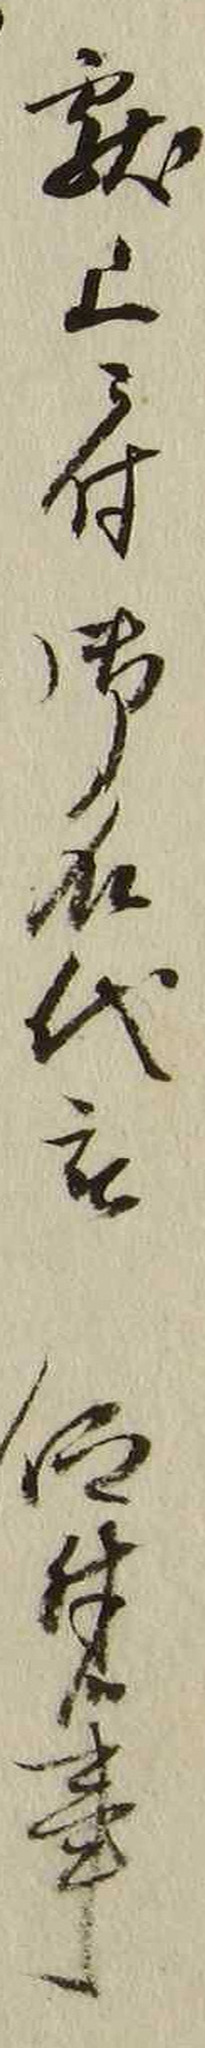献上ニ付御名代被仰付候事
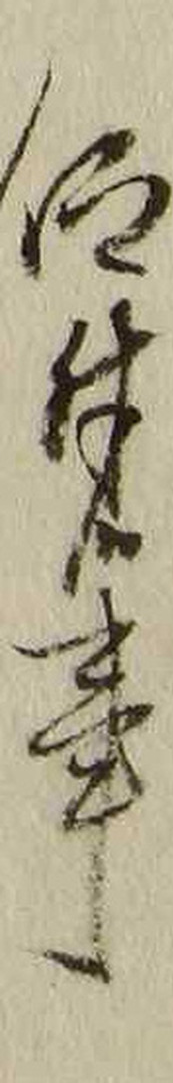仰付候事
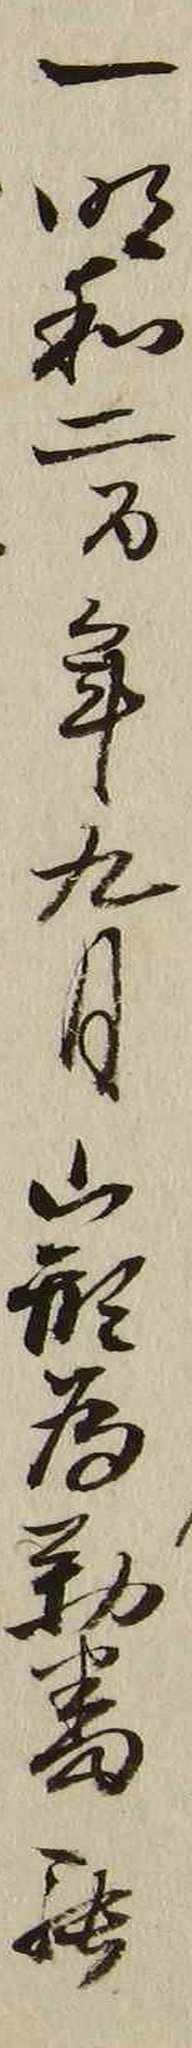一明和二酉年九月山形為勤番罷
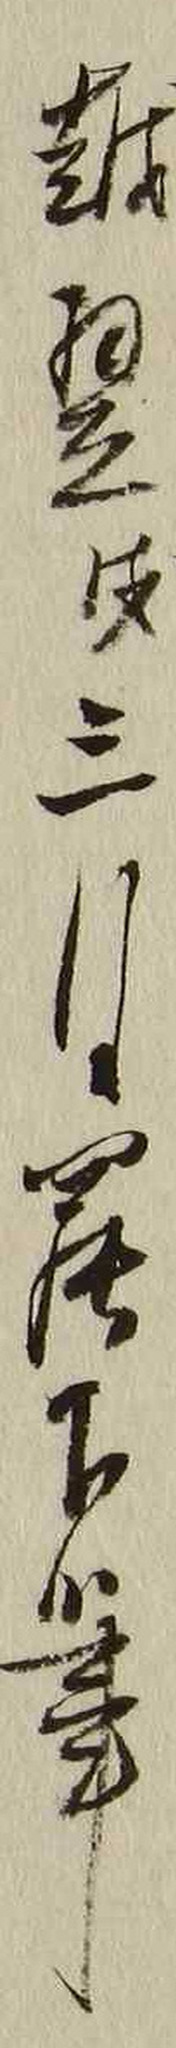越翌戌三月罷下候事
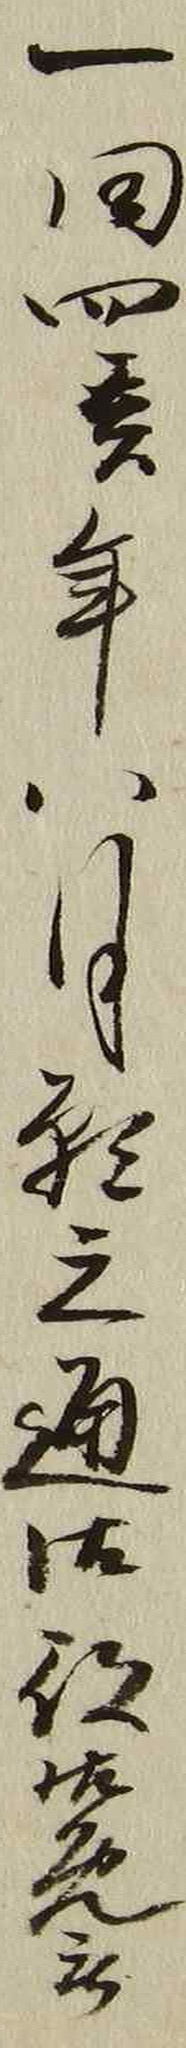一同四亥年八月願之通御役御免被
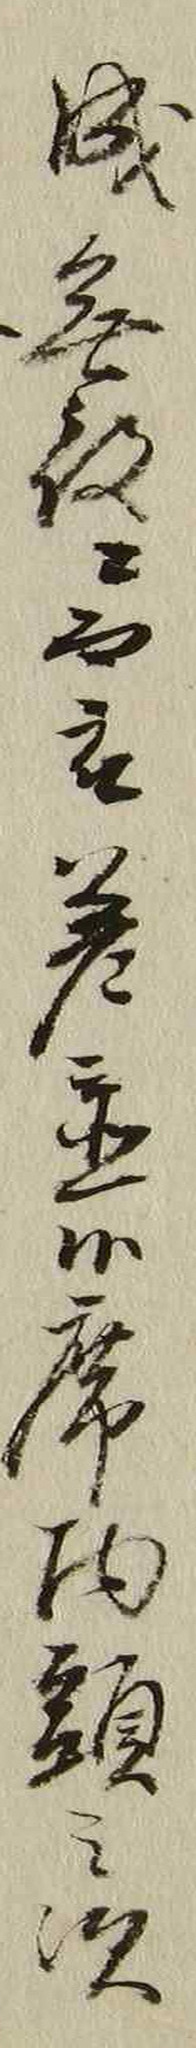成無役ニ而被差置候席物頭之次
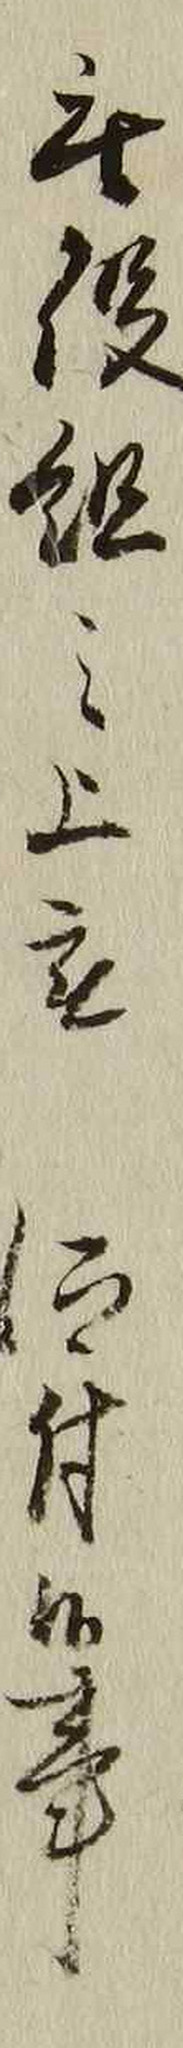無役組之上被仰付候事
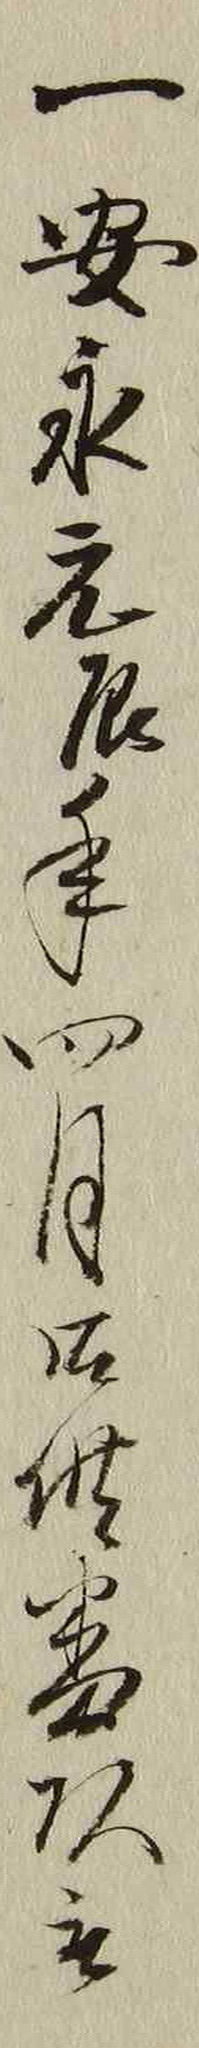一安永元辰年四月御供番頭被
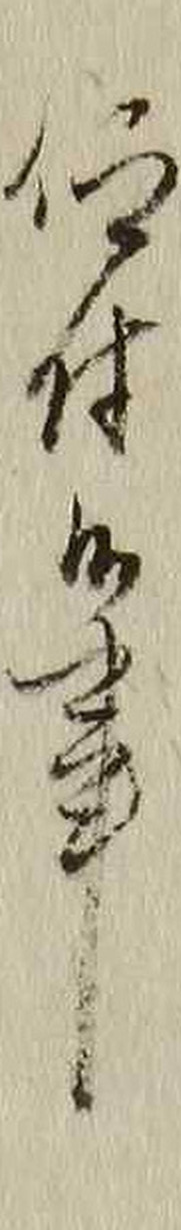仰付候事
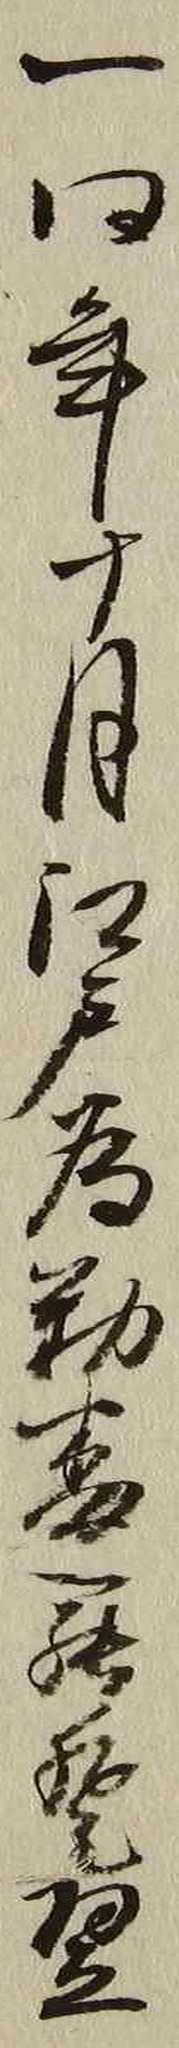一同年十月江戸為勤番罷登翌
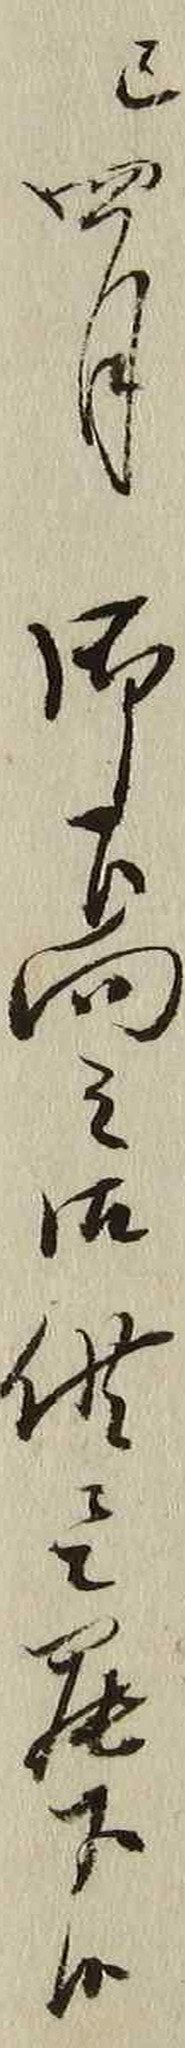巳四月御下向之御供ニて罷下候
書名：諸士系譜　巻之351　す之部1
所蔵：会津若松市立会津図書館
